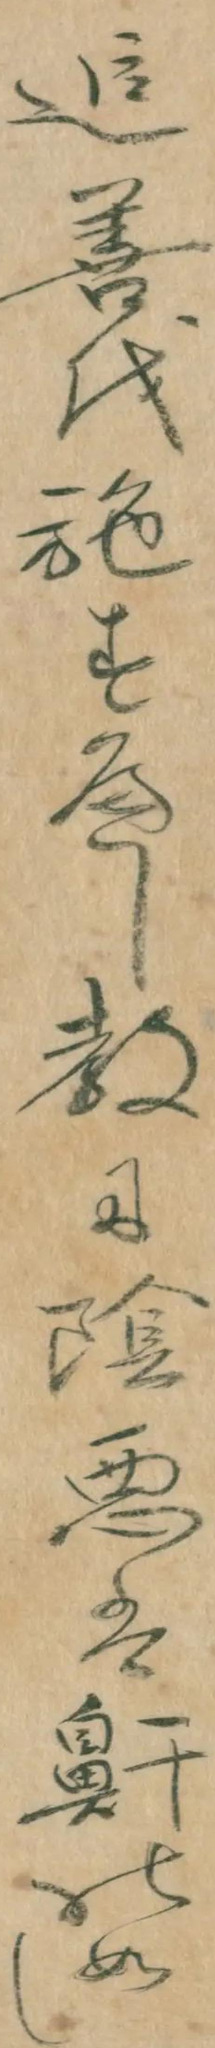追善を施すへし教に陰悪は鼾の如し
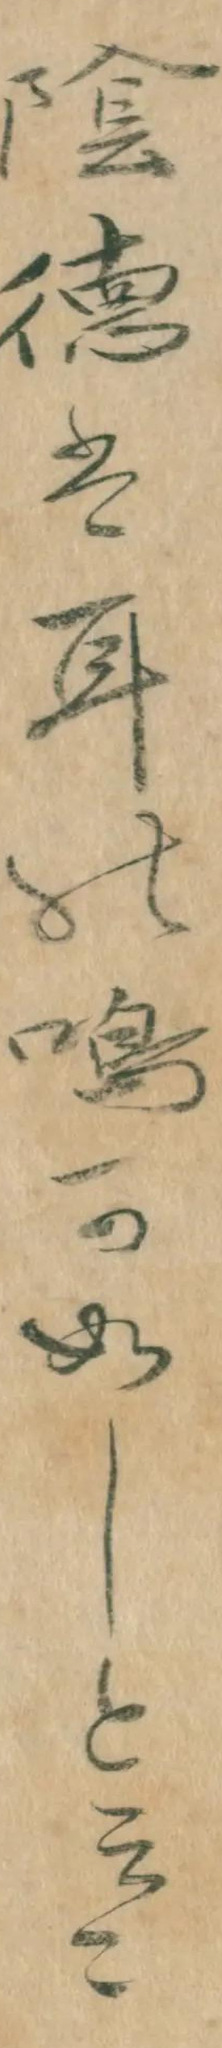陰徳は耳の鳴か如しと云〻
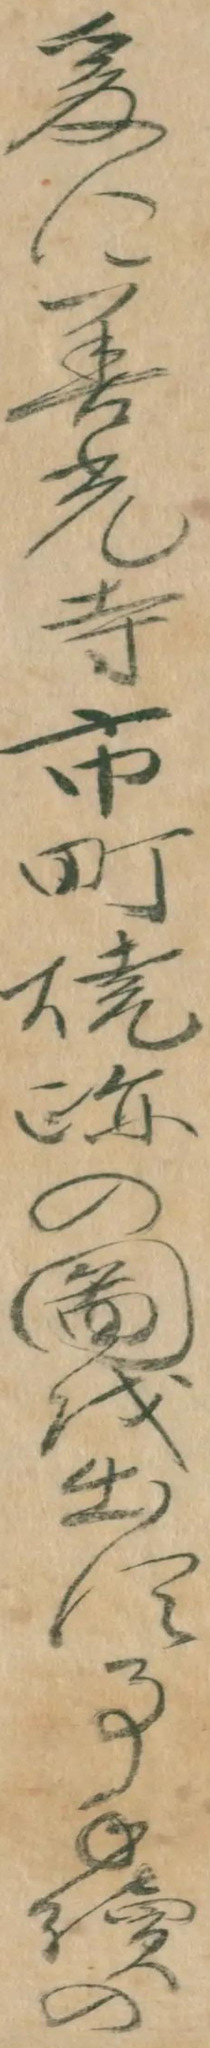爰に善光寺市町焼跡の図を出す事手続の
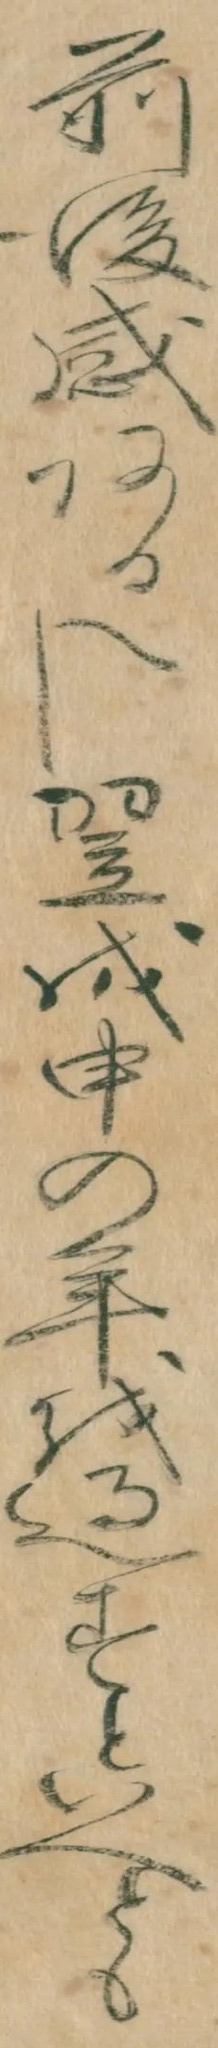前後感あるへし翌戊申の年を過すといへとも
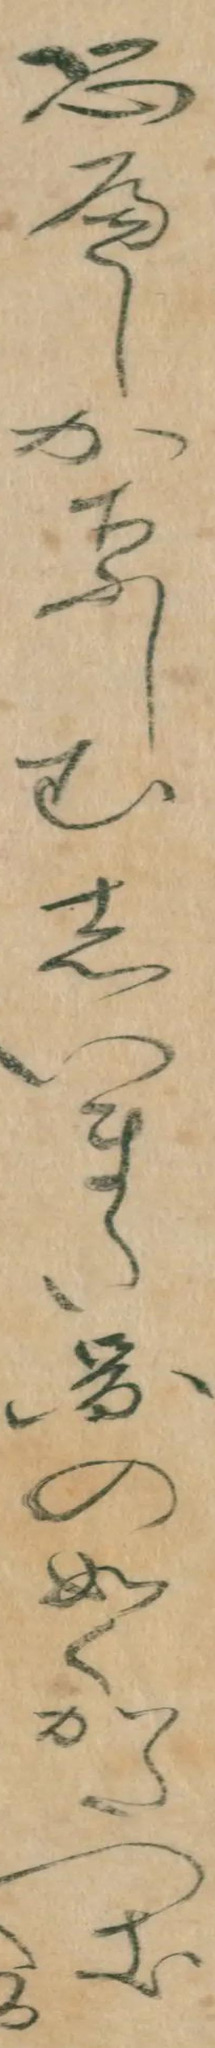恐へしかなしむはいまた図の如くかたつきたる
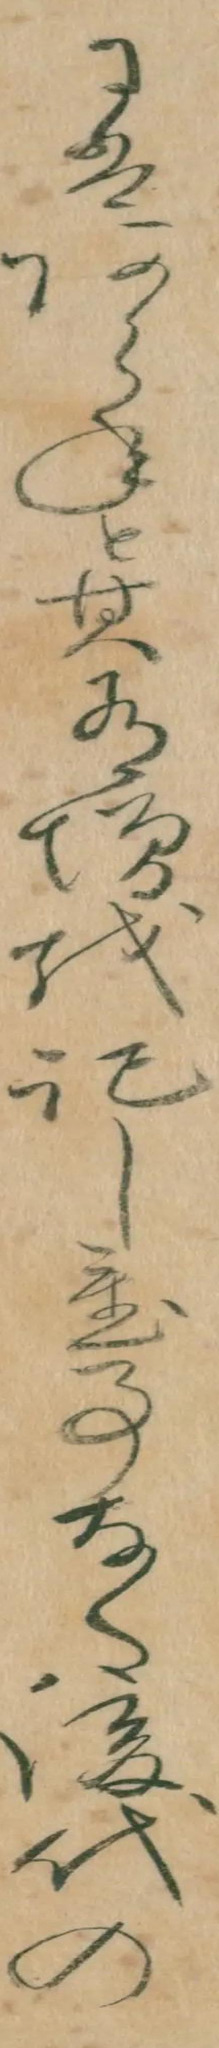にはあらねと其有増を記し置事なくは後代の
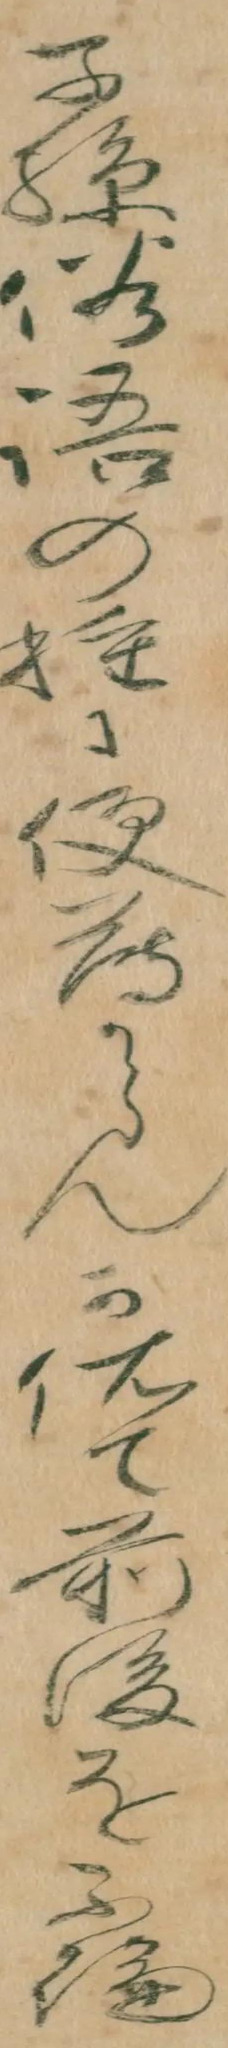子孫俗語の種に便薄からんか依て前後を不論
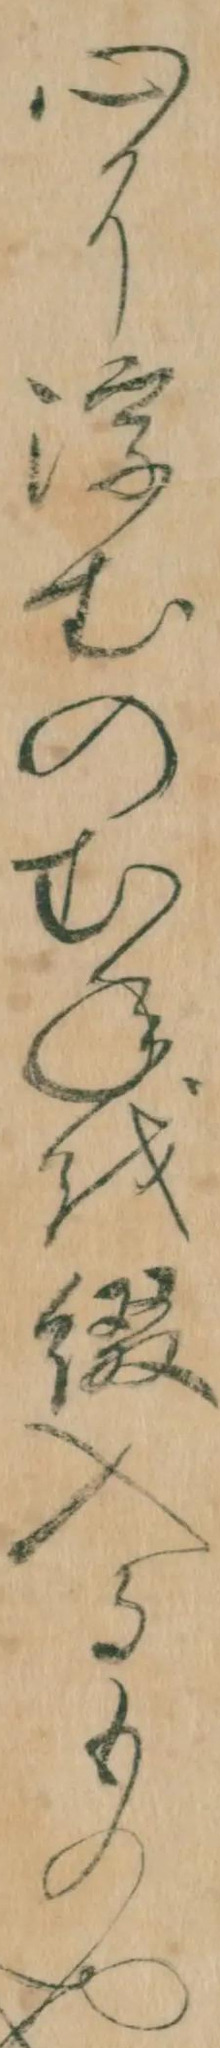心に浮むのむねを綴入るもの也
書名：俗語之種. [4]
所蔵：国立国会図書館 National Diet Library, JAPAN
